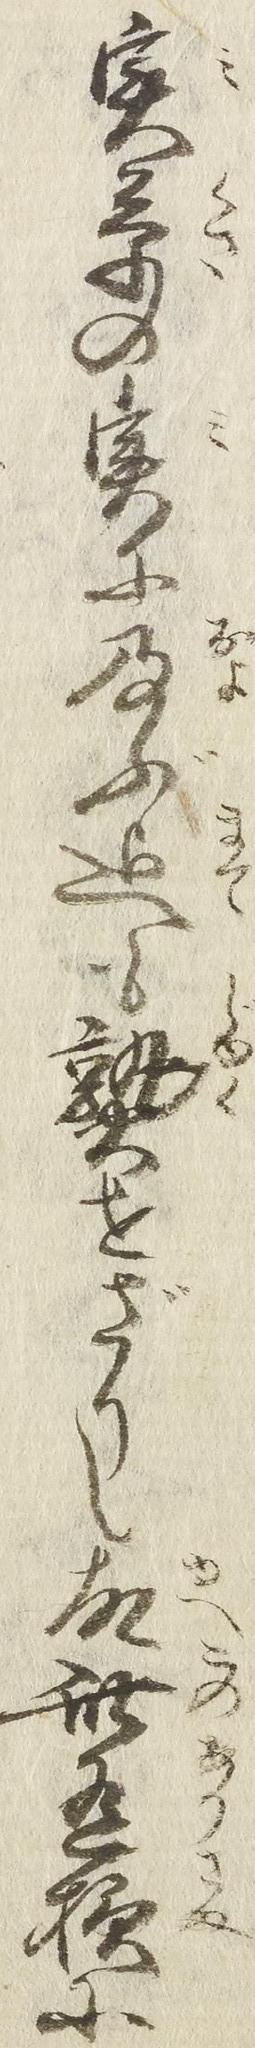実草の実に及ぶ迄も熟せざりし故此有様に
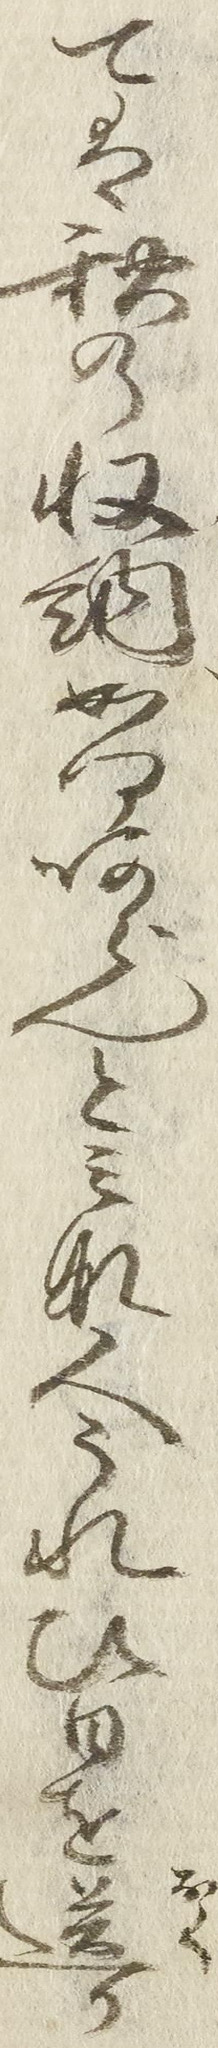ては秋の収納如何あらんとみな人うれひ日を送り
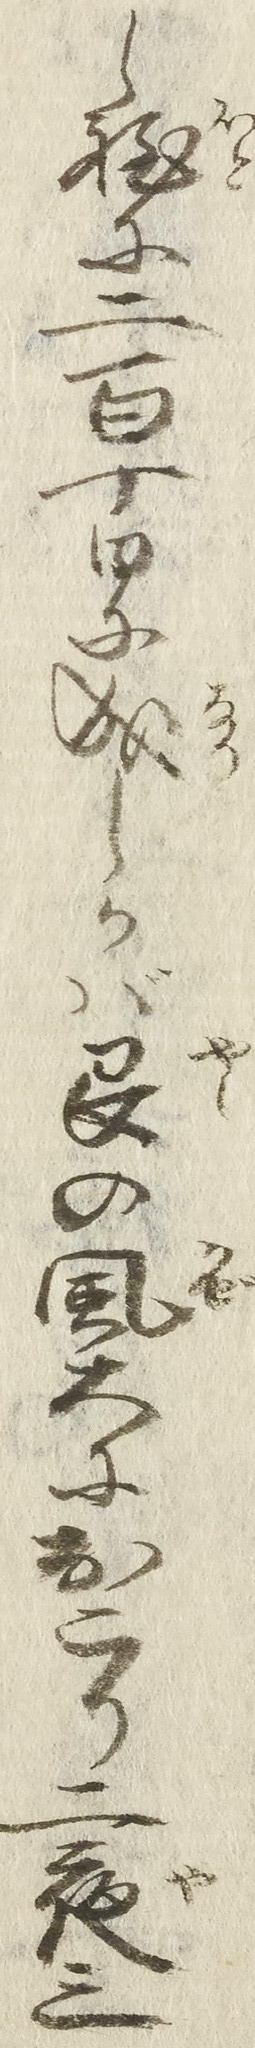し程に二百十日に成しかば艮の風大におこりニ夜三
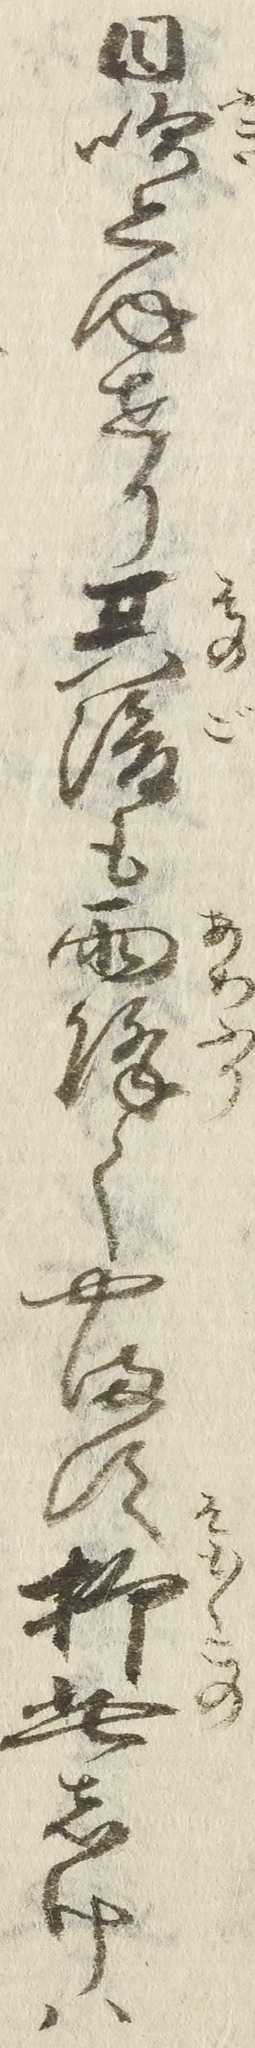日吹とほせり其後も雨降てやます抑此しけは
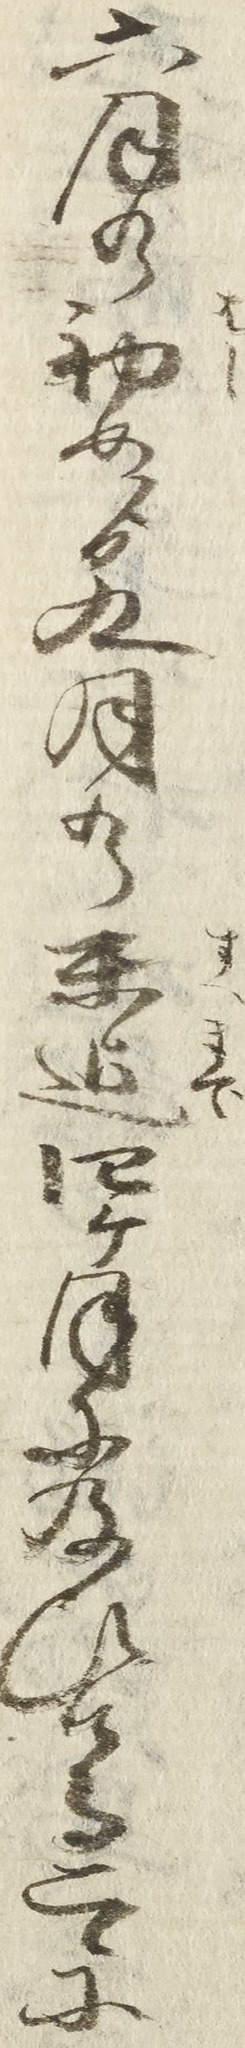六月の初めゟ九月の末迄四ケ月に及ひけるこゝに
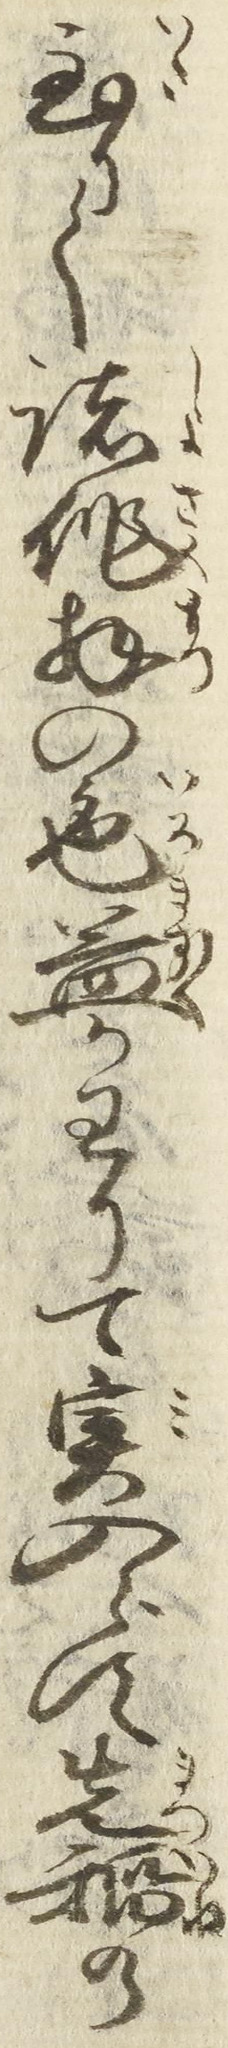至りて諸作物の色益かわりて実入らす先稲の
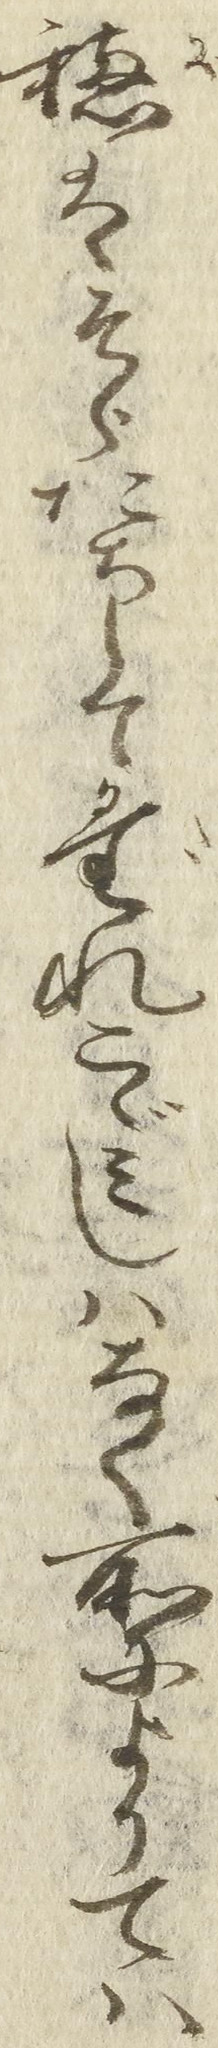穂はそらたちして堂れこゞみしはなく所によりては
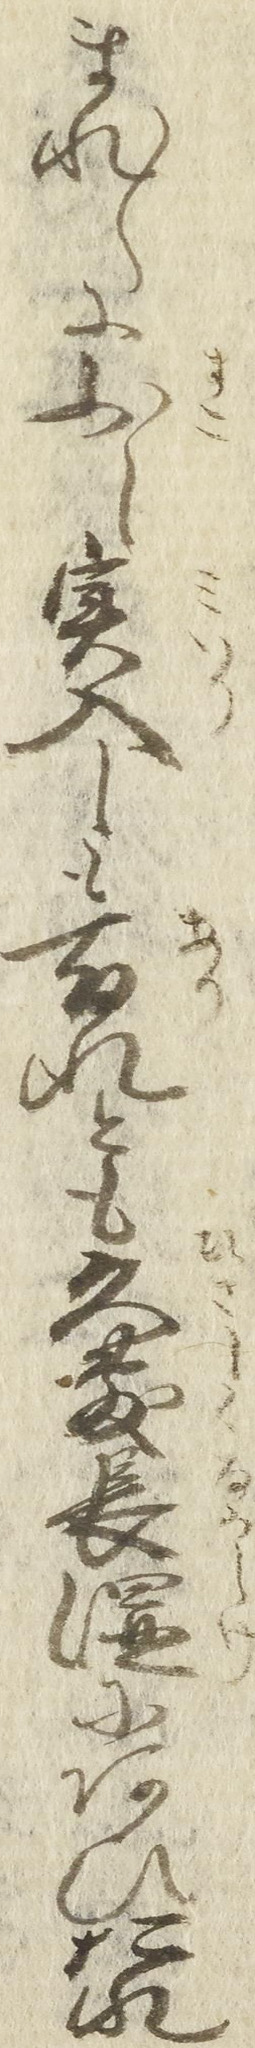まれ〳〵に少し実入しも有れとも久敷長湿にあひたれ
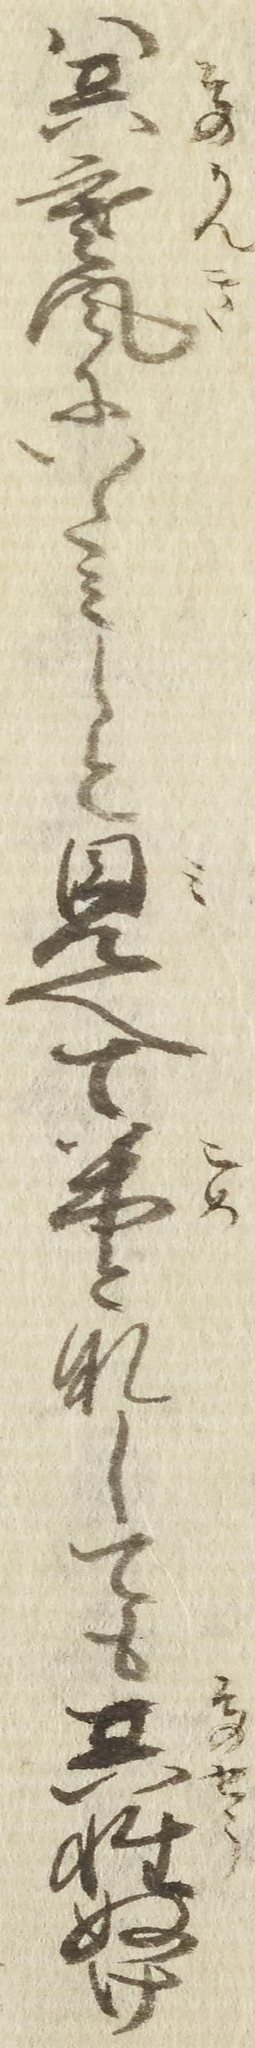は其寒気にいたみしと見へて米となしても其性ぬけ
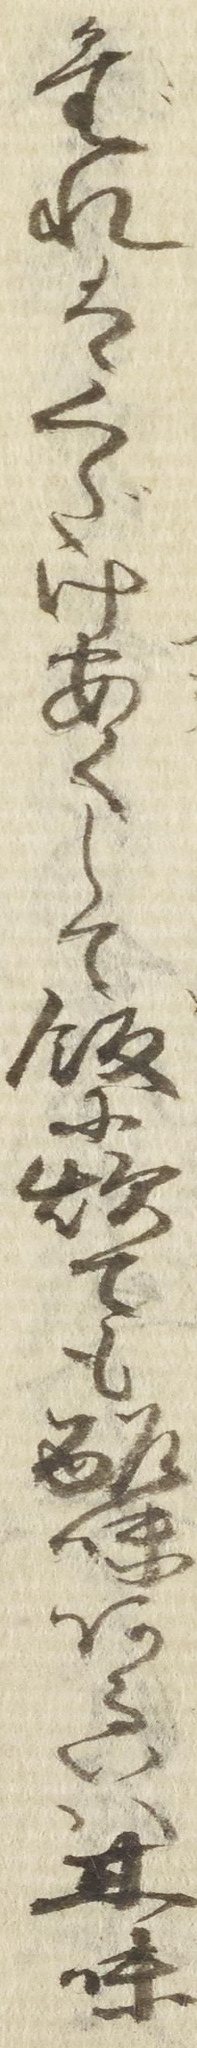堂れはくだけ安くして飯に炊ても酢味あるいは甘味
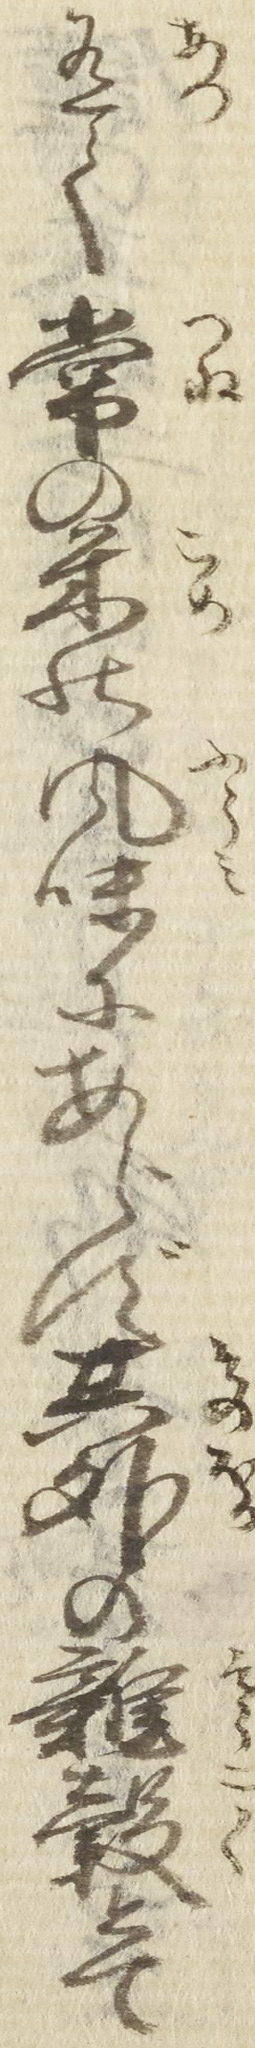有て常の米の風味にあらず其外の雑穀とて
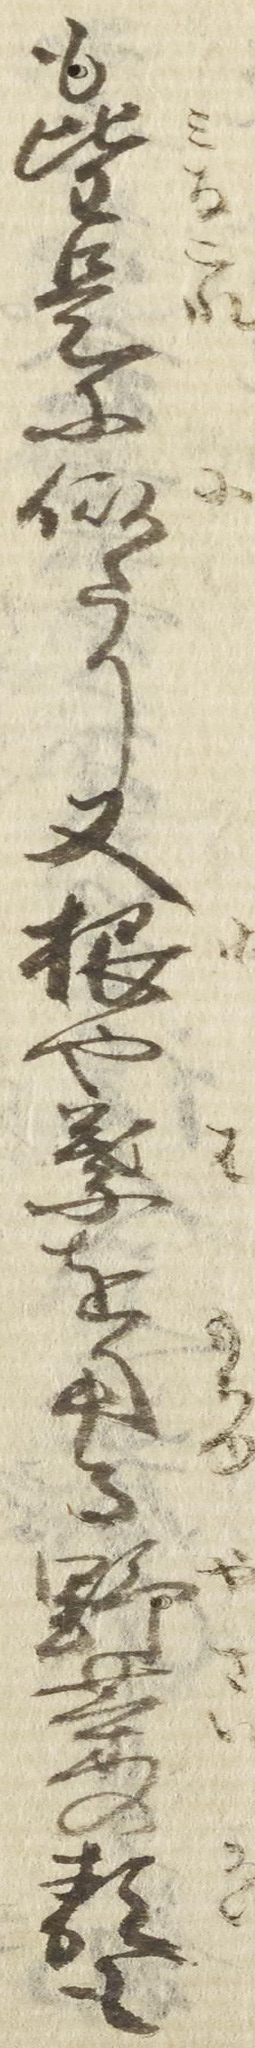も皆是に似たり又根や葉を用る野菜の類も
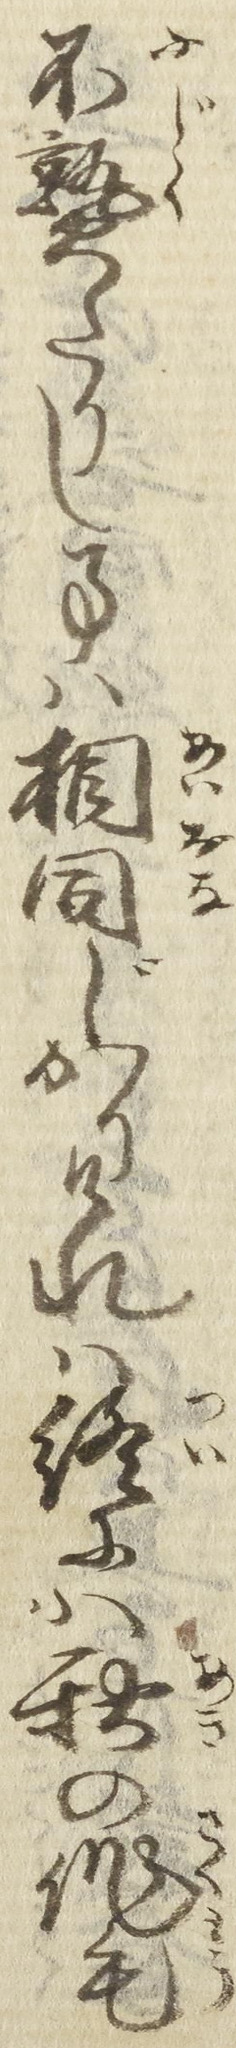不熟たりし事は相同じかりけれは終には秋の作毛

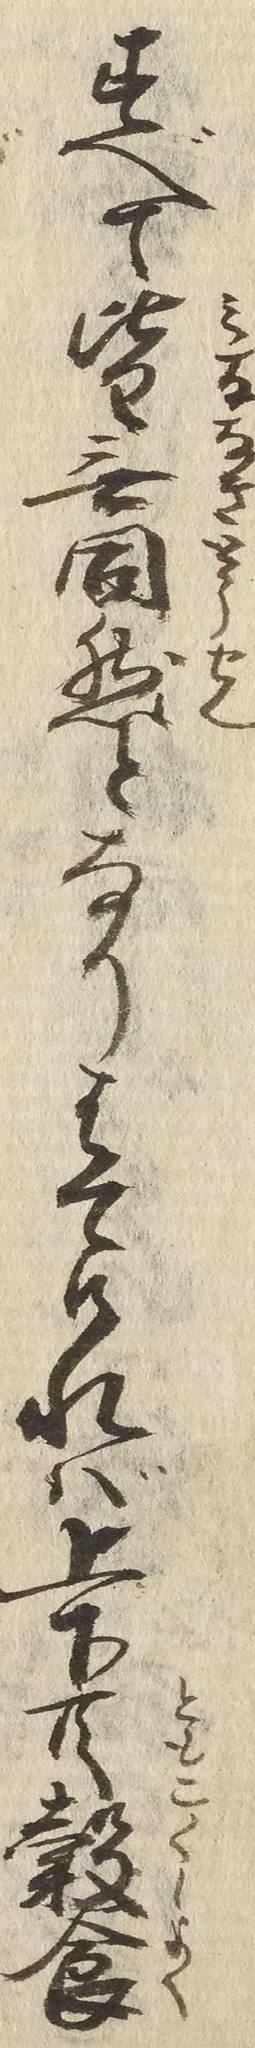すべて皆無同然となりはてければ上下共穀食
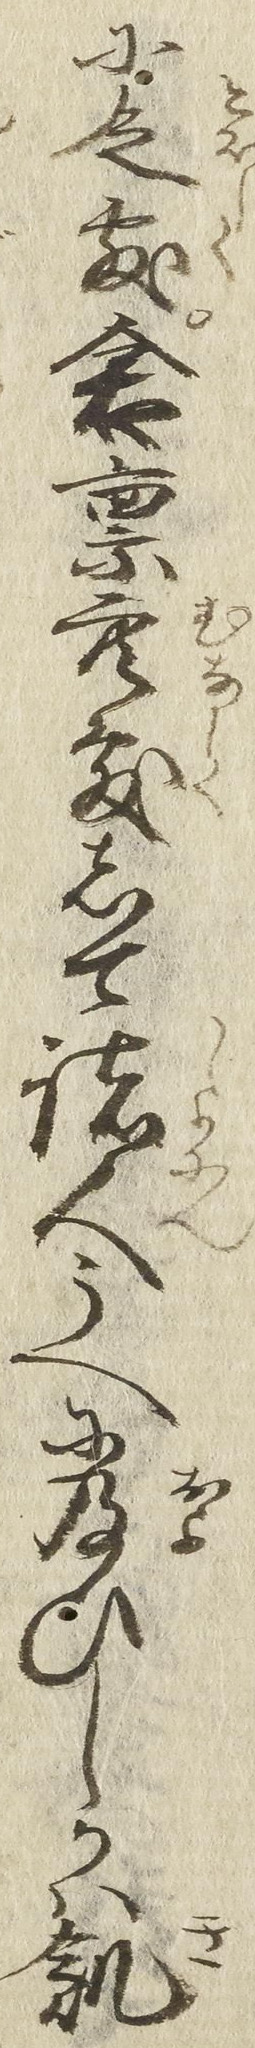に乏敷倉稟空敷して諸人うへに及ひしかは飢
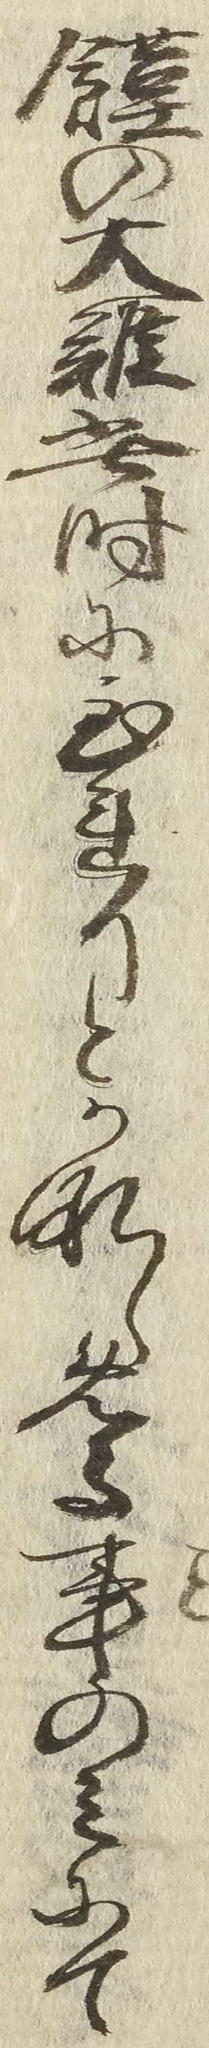饉の大難此時に至れりとかなしめる事のみにて
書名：天明奇畧　全
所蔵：東京大学地震研究所図書室 Earthquake Research Institute Library, The University of Tokyo, JAPAN
